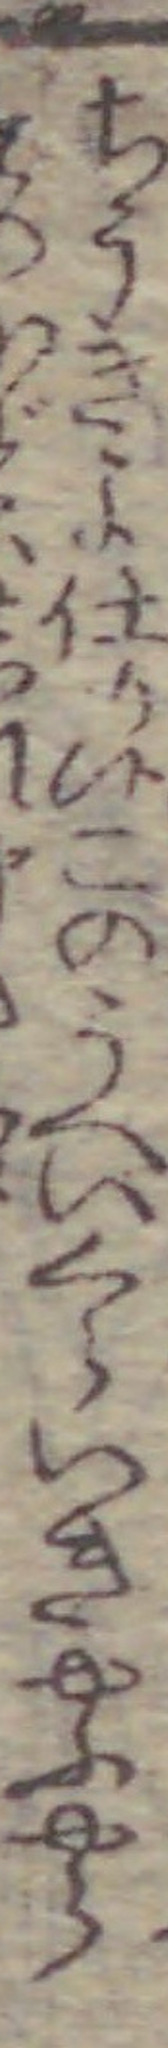ちうきよ仕り候このうへいくらいきやふやら
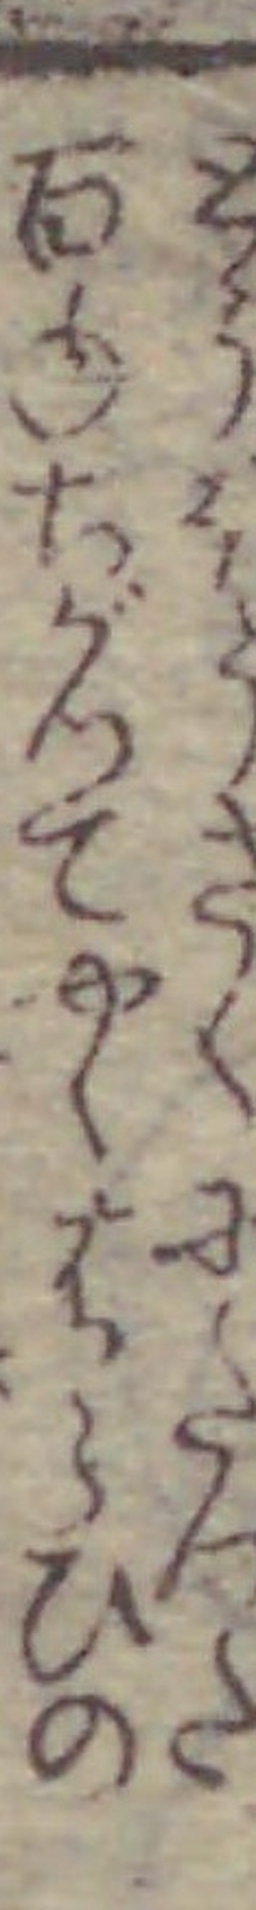百年ちがつてやくはらひの
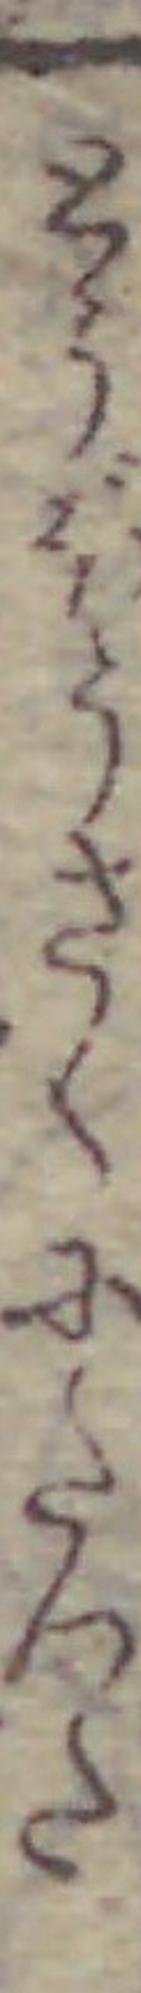とうぼうさくにたつた
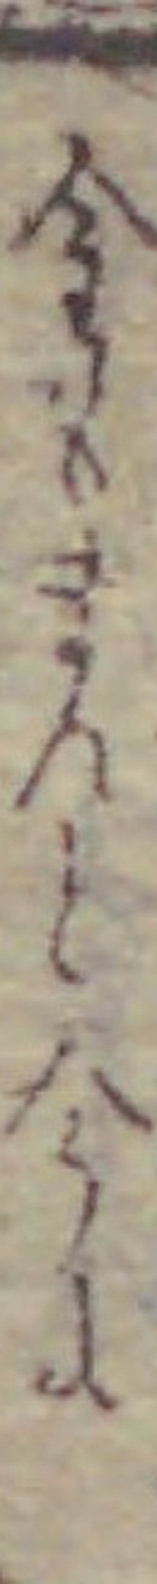金もまんと今に
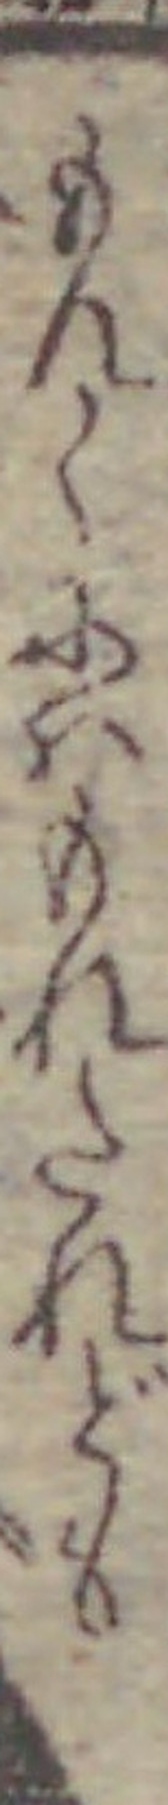もんくにはもれたれども
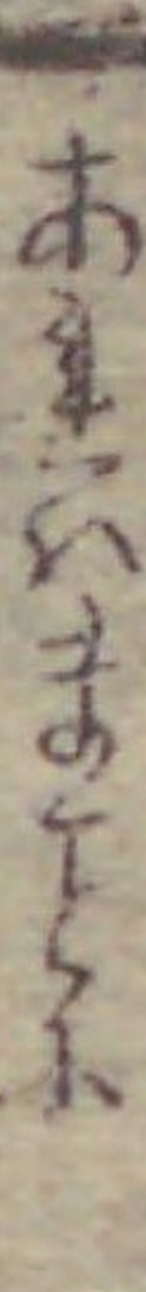あれはまことに
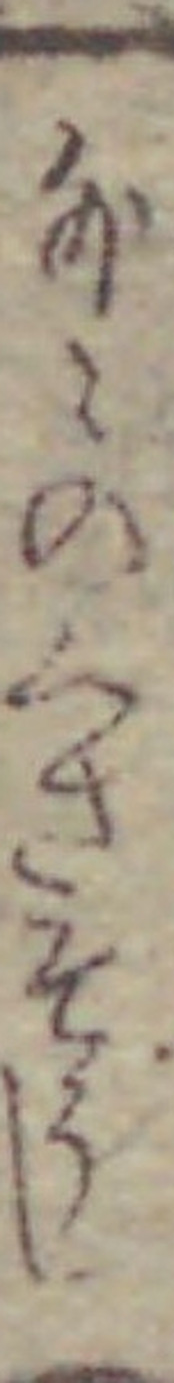外々のくさそうし
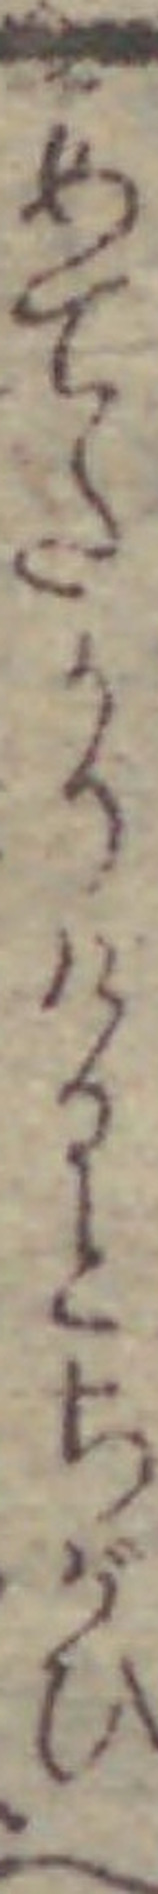めてたかりけるとちがひ
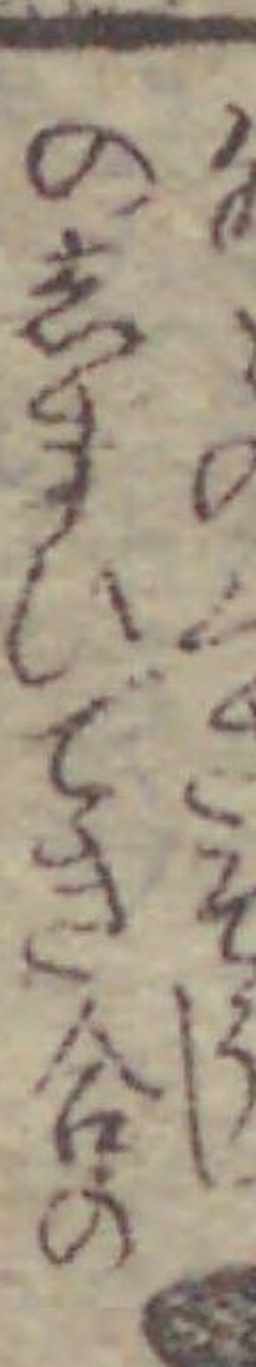のしまひでき合の
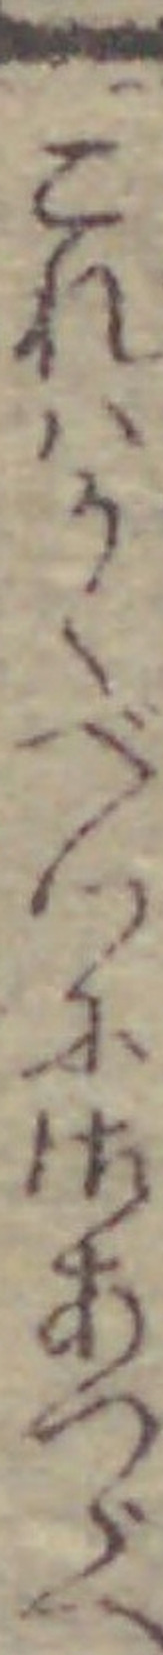これはかくべつに御あつらへ
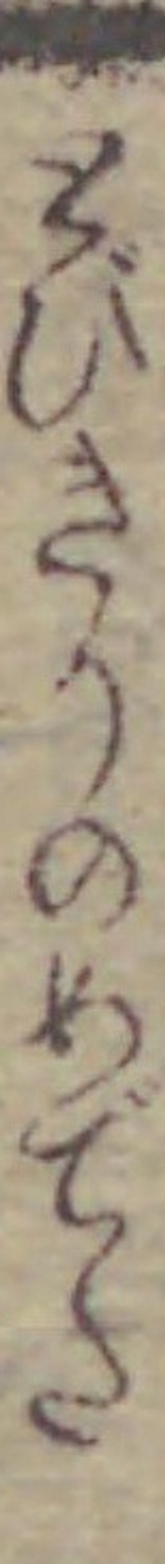とびきりのめでた
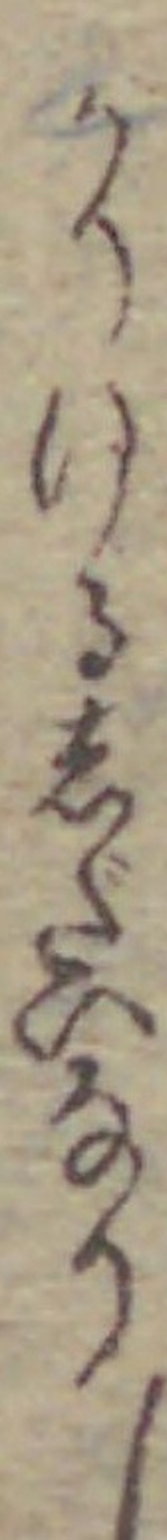かりけるしだいなり
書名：箱入娘面屋人魚 3巻
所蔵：国立国会図書館 National Diet Library, JAPAN
